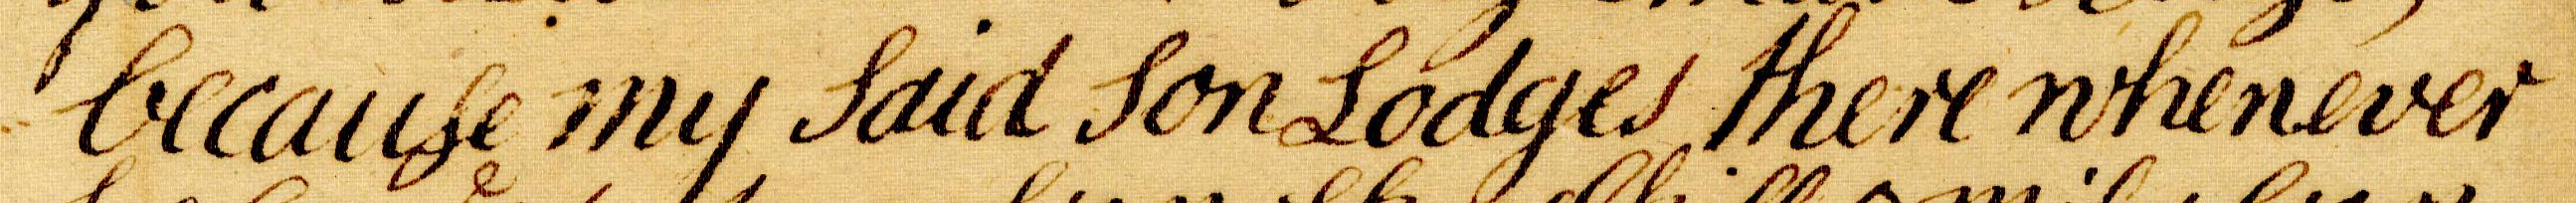because my Said Son Lodges there whenever
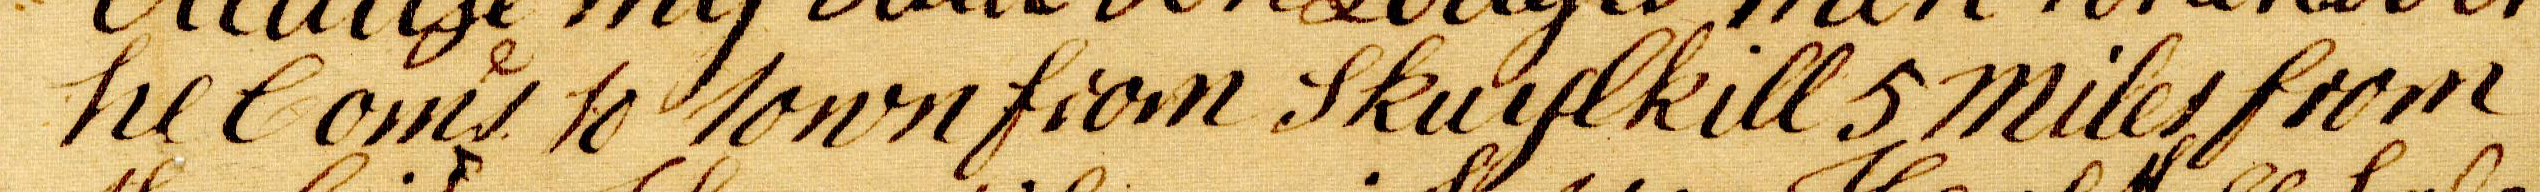he Comes to town from Skuylkill 5 Miles from
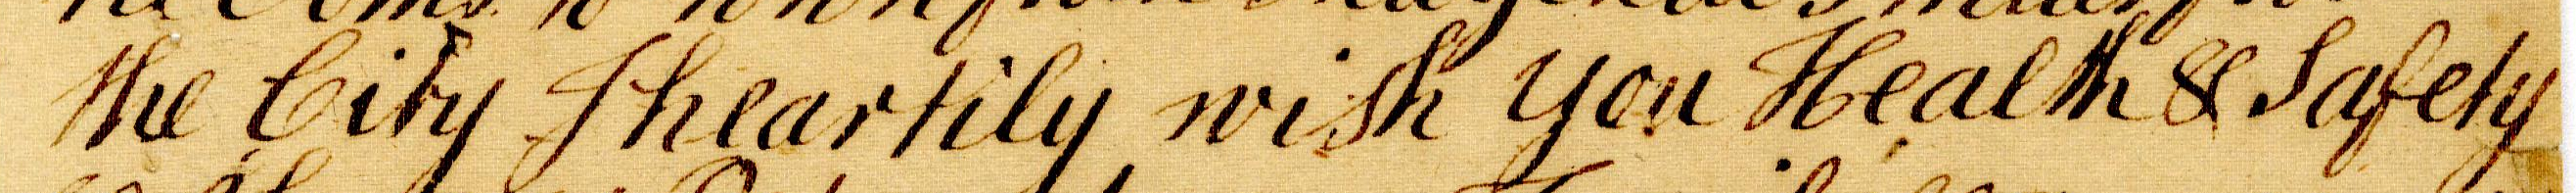the City I heartily wish You Health & Safety
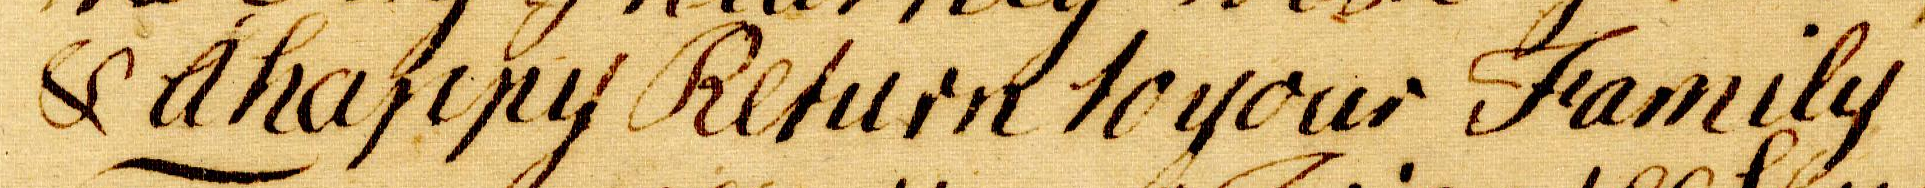& A happy Return to your Family
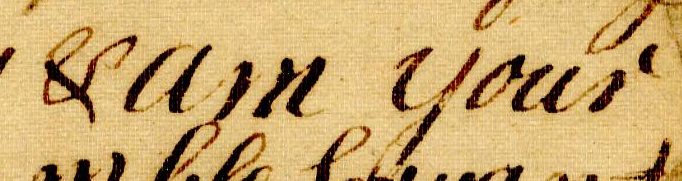& am Your
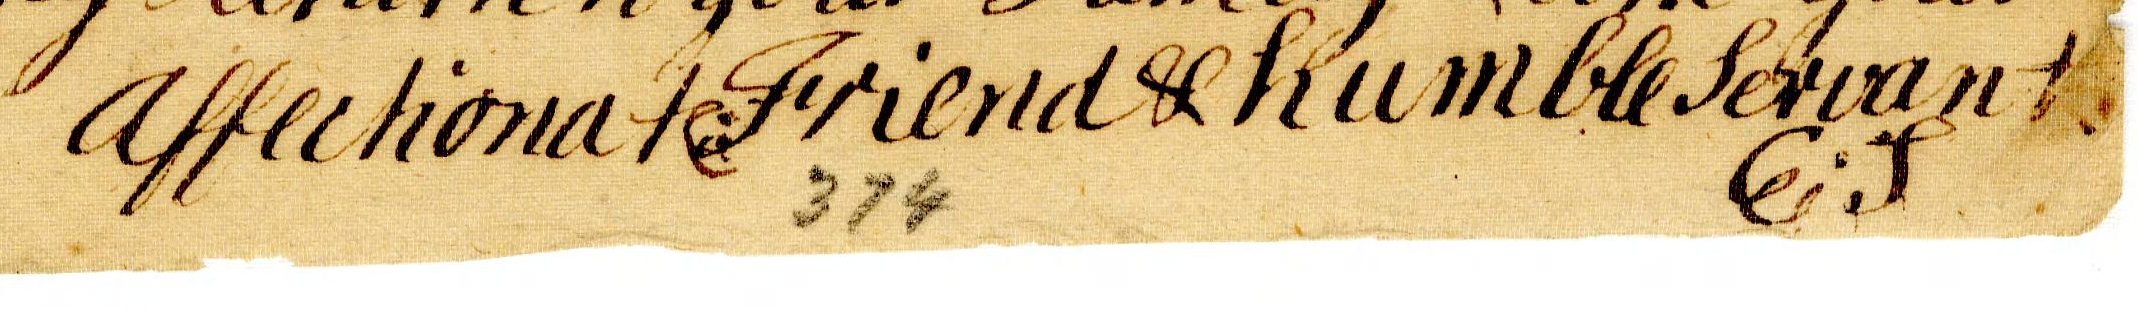Affectionate Friend & humble Servant
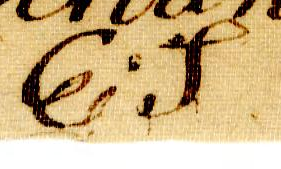E:S
